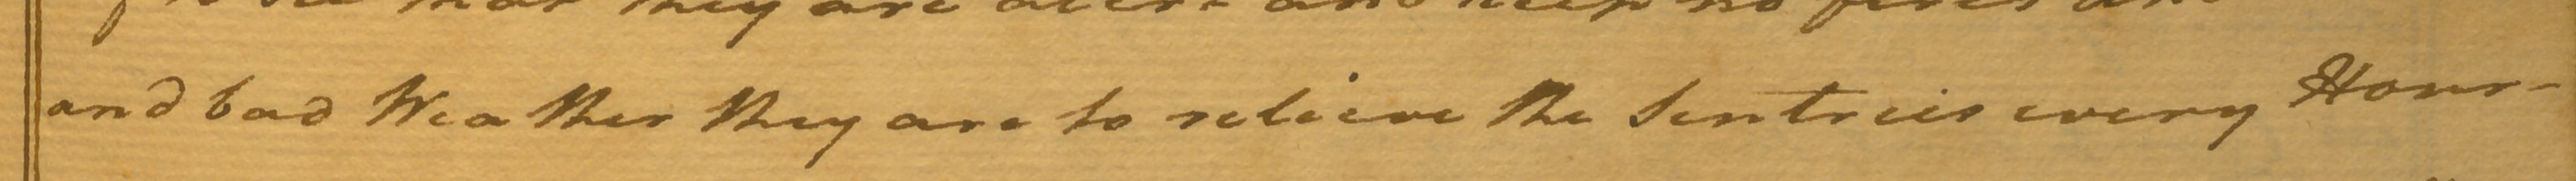and bad Weather they are to relieve the Sentries every Hour-
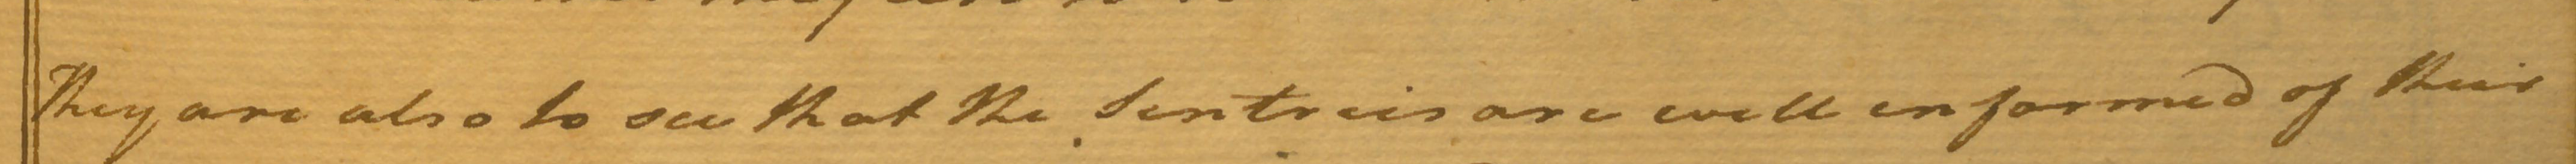They are also to see that the Sentries are well informed of this
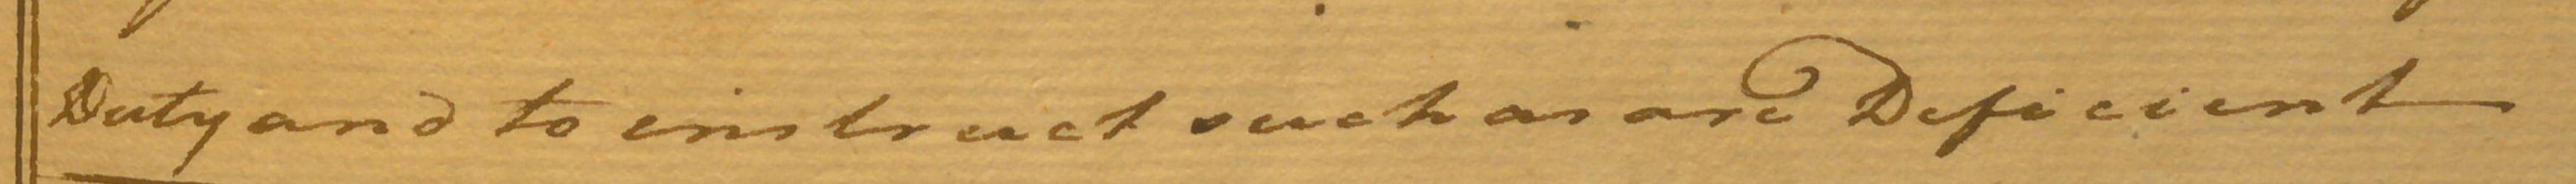Duty and to instruct such as are Deficient-
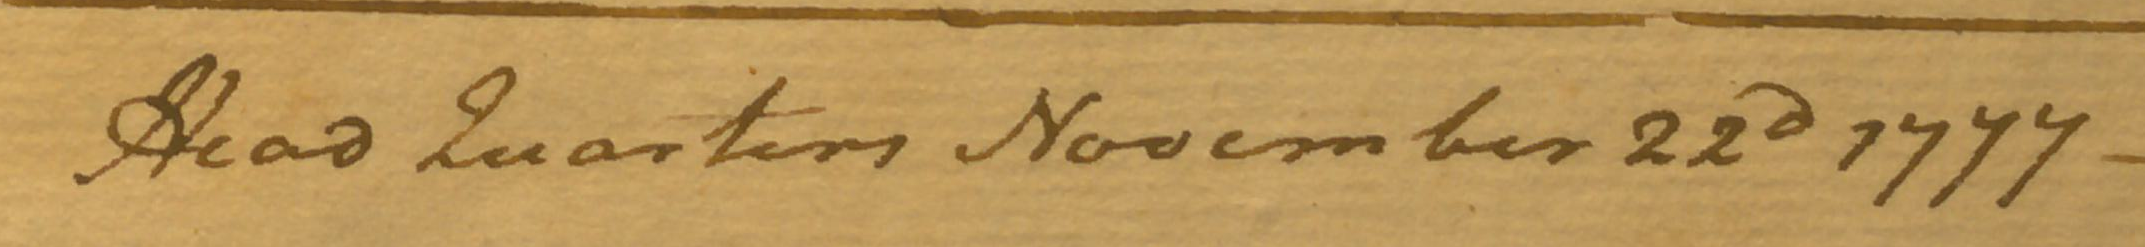Head Quarters November 22^d 1777-
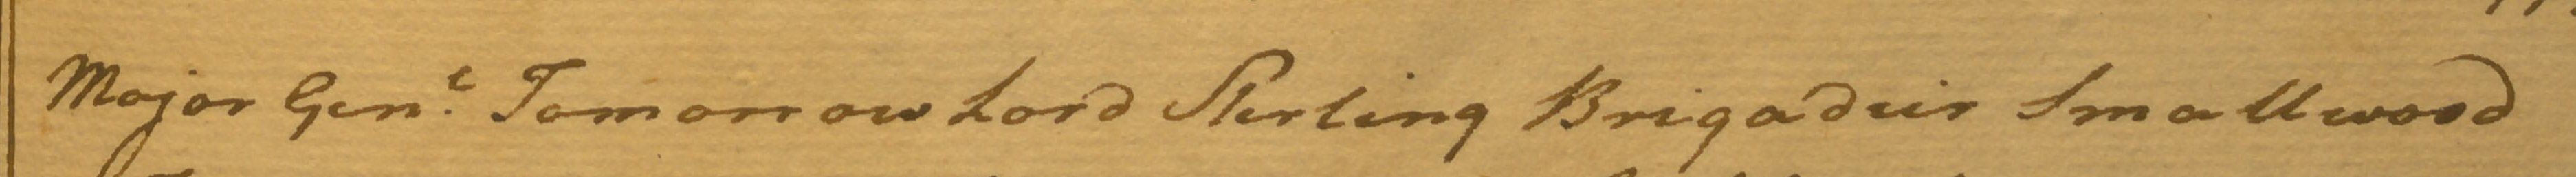Major Gen^l. Tomorrow Lord Sterling Brigadier Smallwood
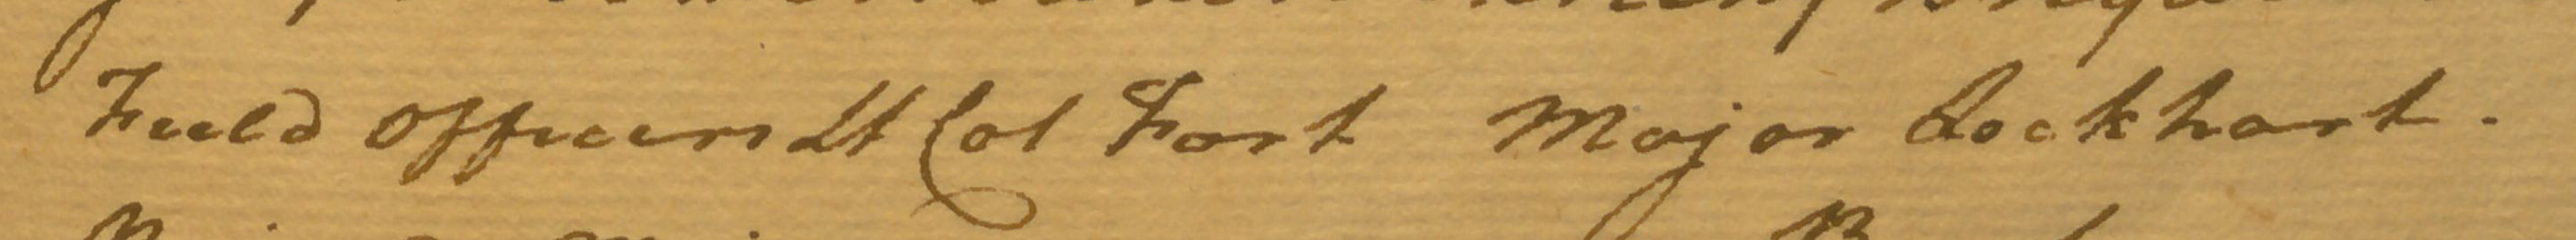Field Officrs Lt Col Fort Major Lockhart.
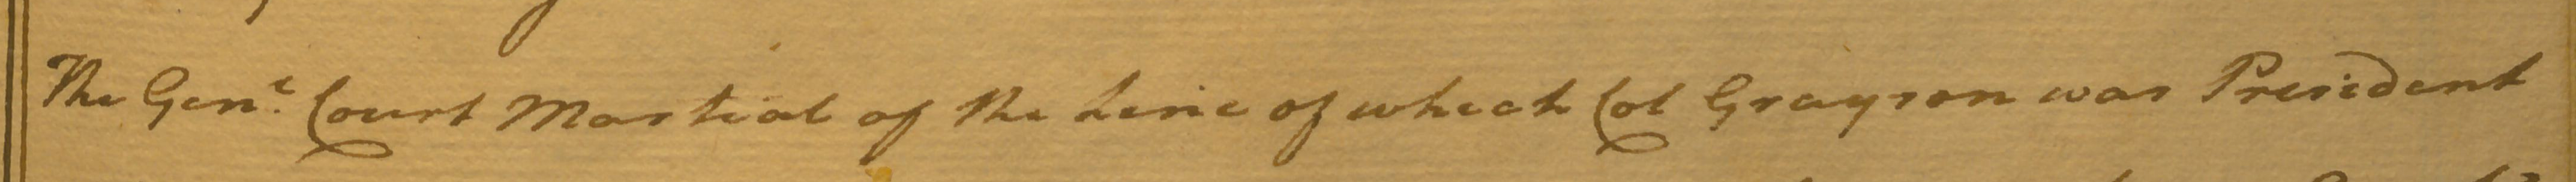The Gen^l. Court Martial of the Line of which Col Grayson was President
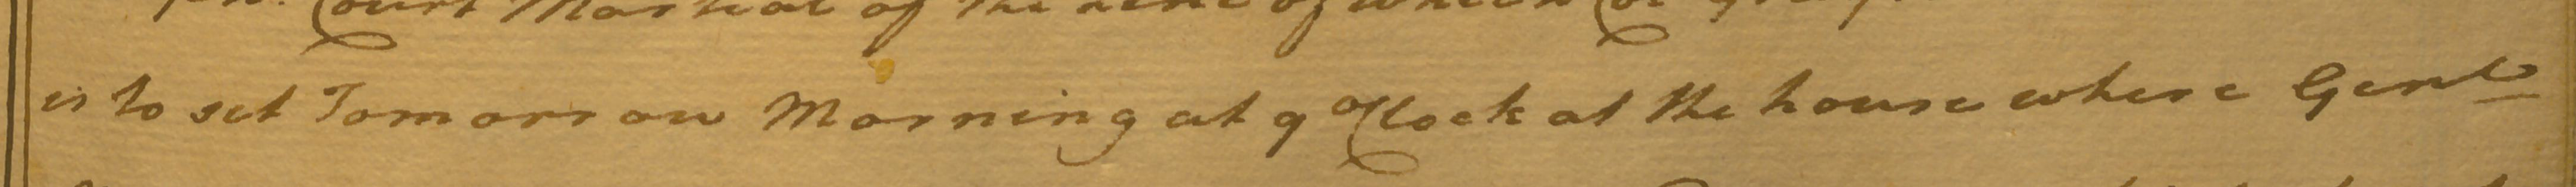is to set Tomorrow Morning at 9 ^oClock at the house where Gen^l
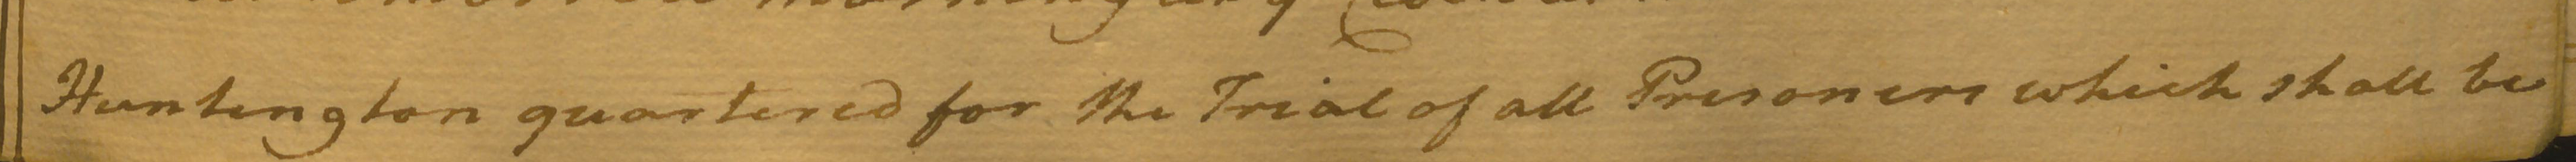Huntington quartered for the Trial of all Prisoners which shall be
